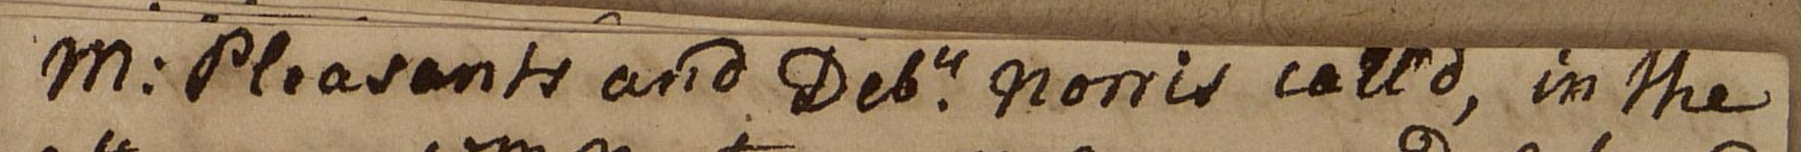M: Pleasents and Deb^y. Norris calld, in the
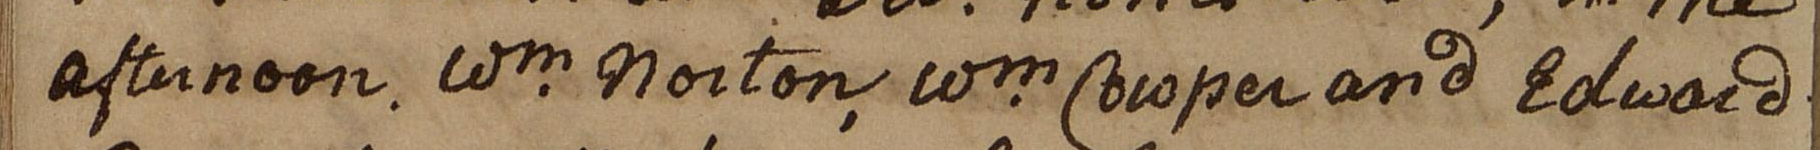afternoon, W^m. Norton, W^m. Cowper and Edward
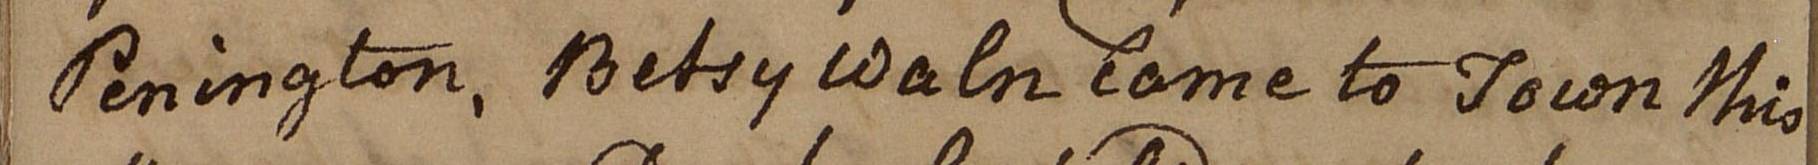Penington, Betsy Waln came to Town this
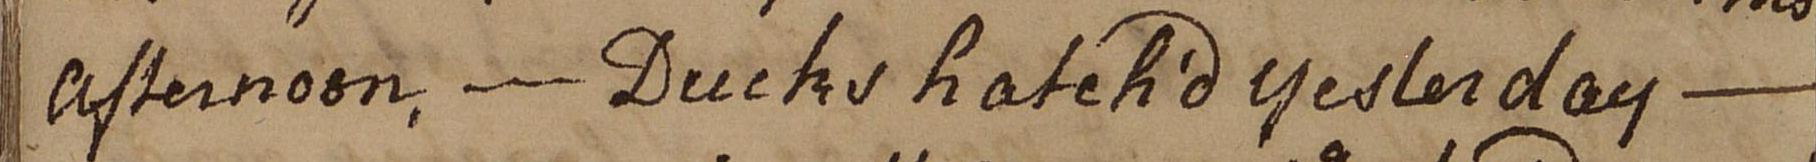Afternoon,- Ducks hatch'd Yesterday-
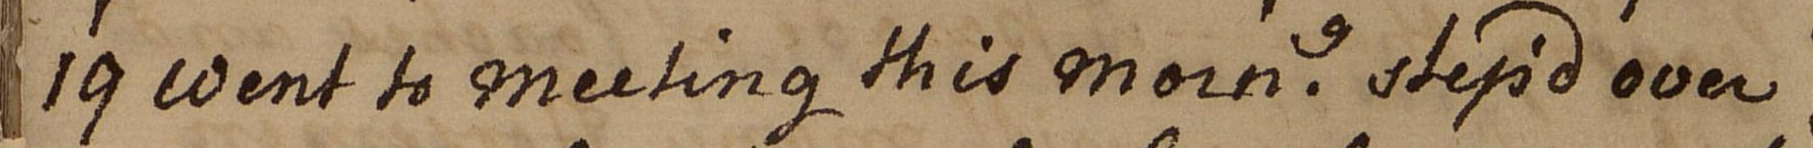19 Went to meeting this morn^g. step'd over
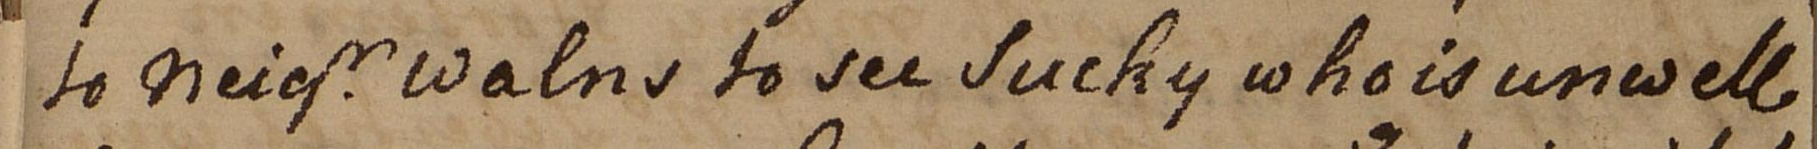to Neig^r. Walns to see Sucky who is unwell,
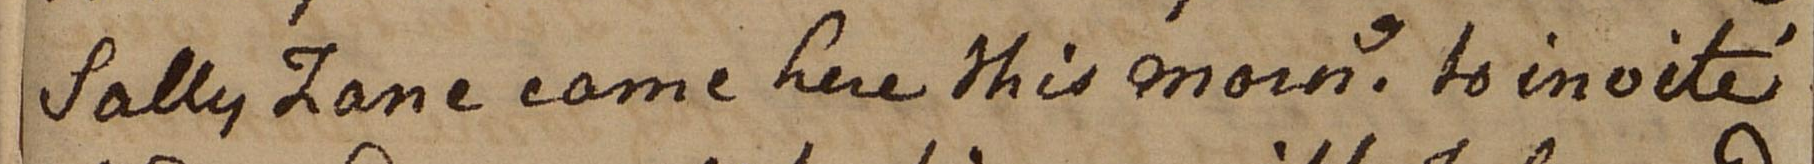Sally Zane came here this morn^g. to invite
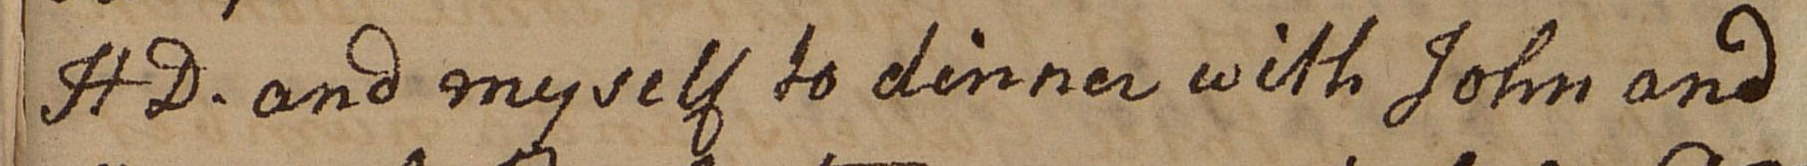HD. and myself to dinner with John and
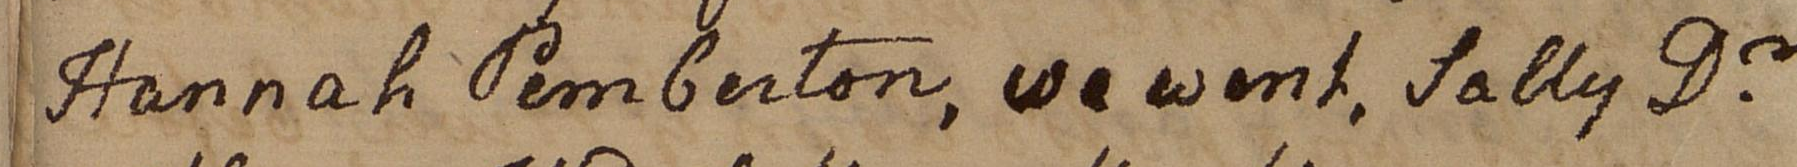Hannah Pemberton, we went, Sally D^r.
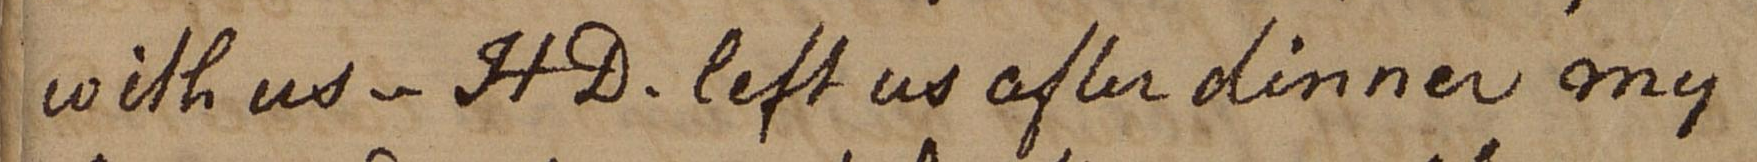with us- H D. left us after dinner my
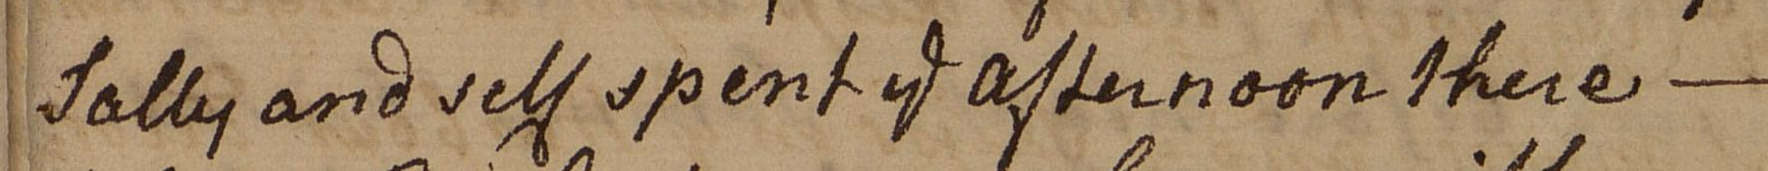Sally and self spent y^e afternoon there-
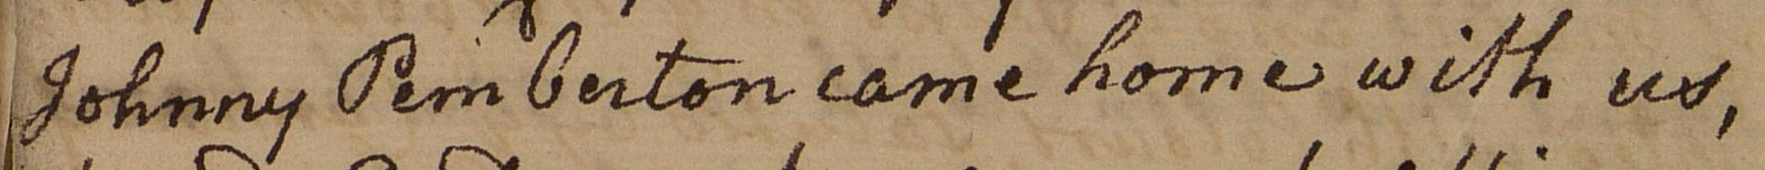Johnny Pemberton came home with us,
